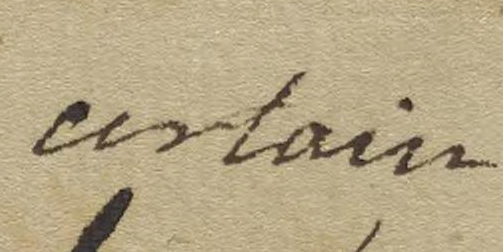certain
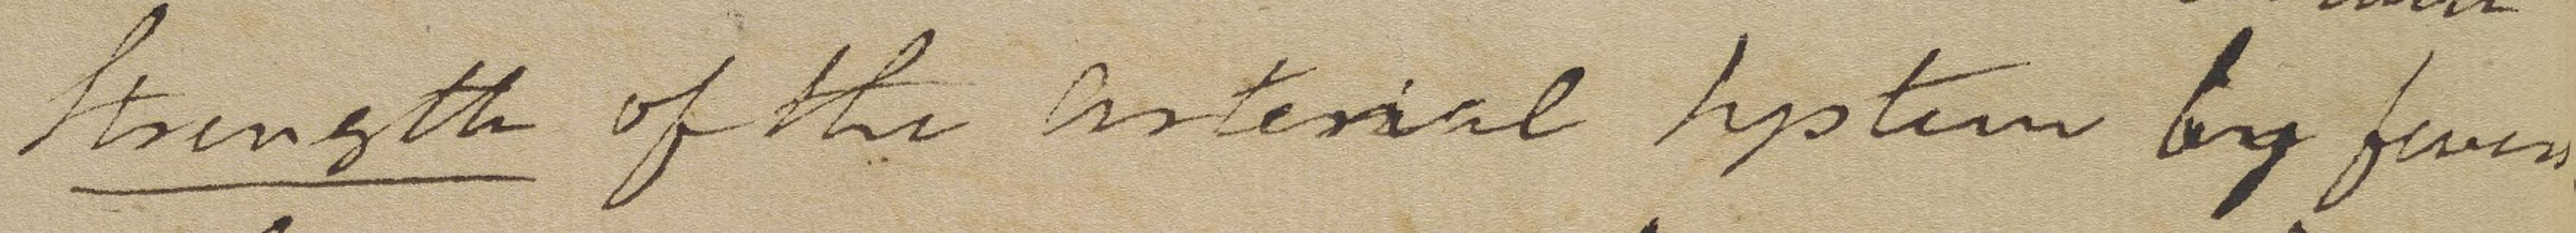Strength of the arterial system by ^ fevers
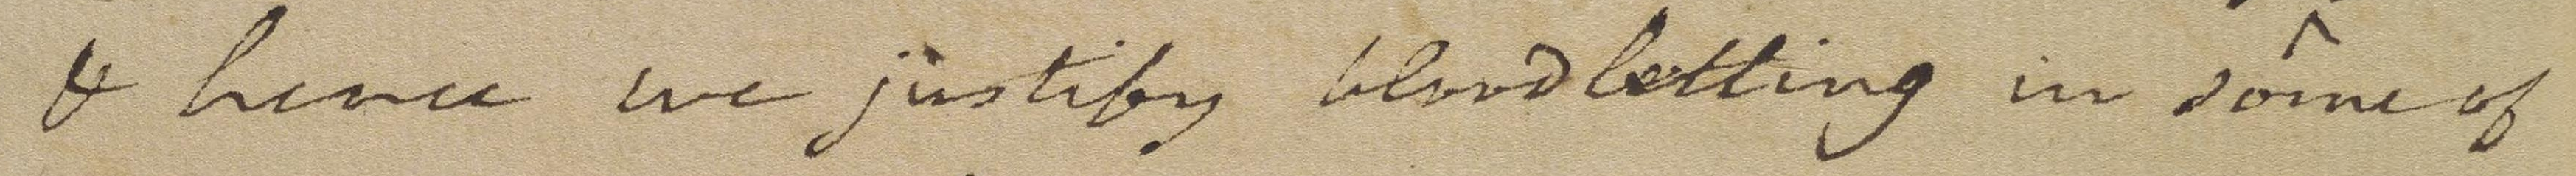& hence we justify bloodletting in some of
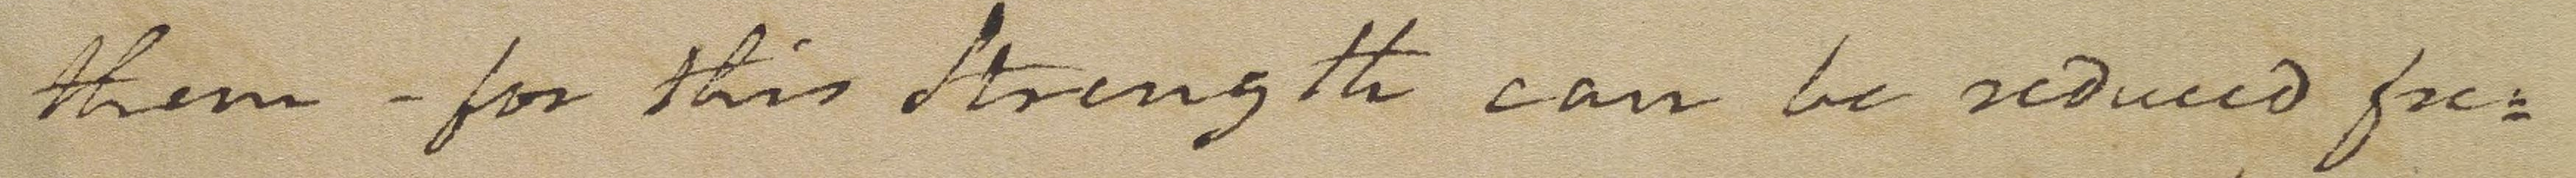them, for this strength can be reduced fre-
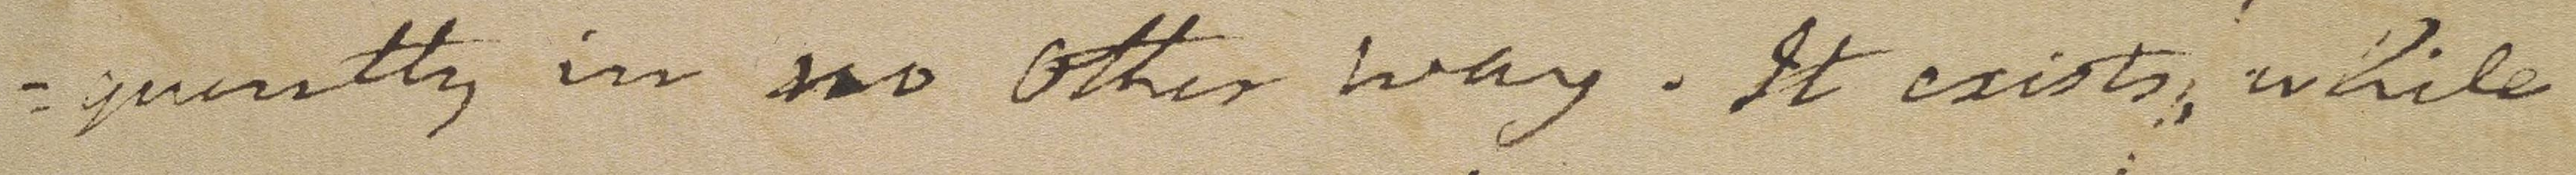-quently in no other way. It exists, while
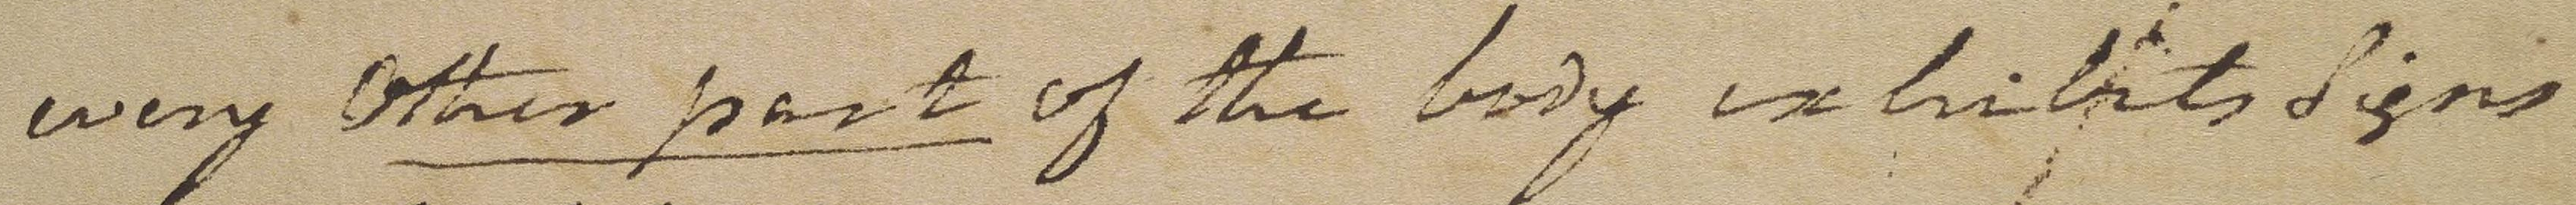every other part of the body exhibits signs
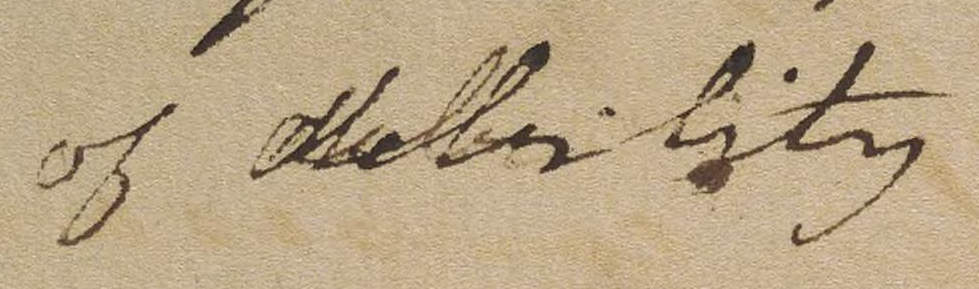of debility.
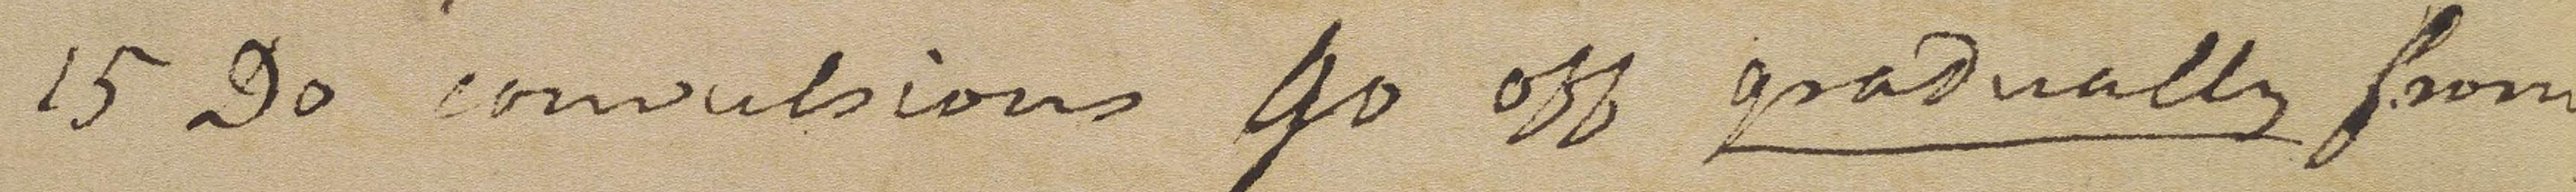15 Do convulsions go off gradually from
